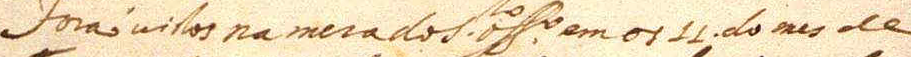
Foraõ uistos na meza do s.to off.o em os 11. do mes de
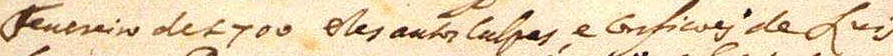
Feuereiro de 1700 estes autos Culpas, e conficoes̄ de Luis
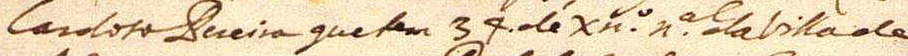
Cardoso Pereira que tem 34. de xn.o n.al da villa de
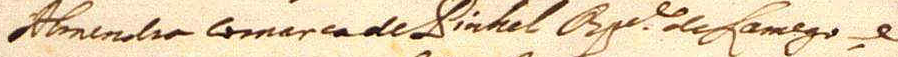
Almendra comarca de Pinhel Bp.do de Lamego, e
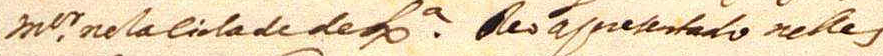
m.or nesta cidade de Lxa. Reo apresentado nelles
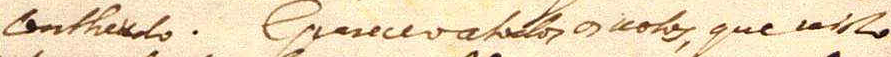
contheudo. E pareceo a todos os uotos, que uisto
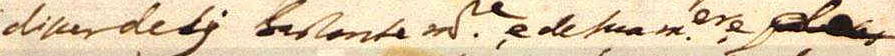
disser de sy bastantem.te, e de sua m.er, e p____
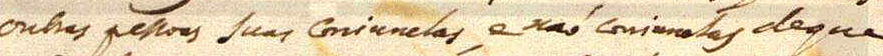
outras pessoas suas coniunctas, e naõ coniunctas de que
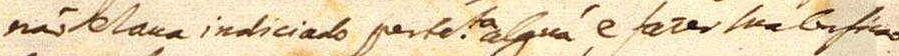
naõ estaua indiciado por tes.ta alguā, e fazer sua Conficaõ
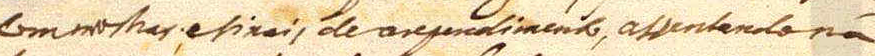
com mostras; e sinais de arependimento, assentando na
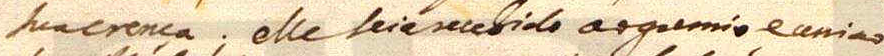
sua crença; elle seia recebido ao gremio e uniaõ
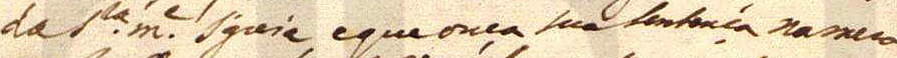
da sta. m.e Igreia, e que ouça sua sentença na mesa
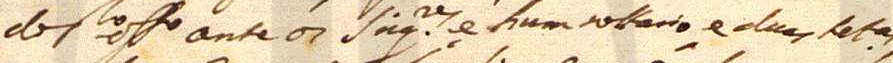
do sto offo ante os Inq.res e hum nottario, e duas test.as,
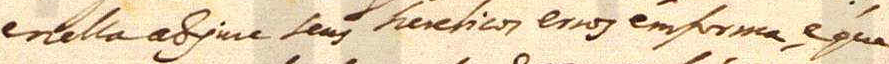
e nella abjure seus hereticos erros em forma, e que
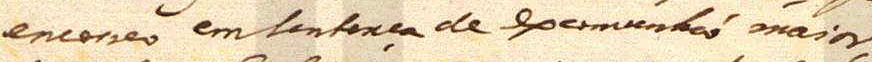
encorreo em sentença de excomunhaõ maior,
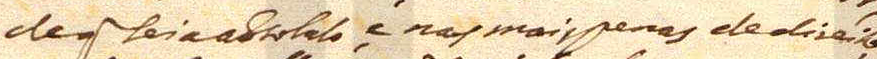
de q̄ seia absoluto, e nas mais penas de direito,
